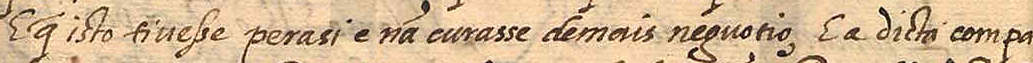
E q̅ isto tiuesse pera si e nā curasse de mais neguotio, E a dicta compa
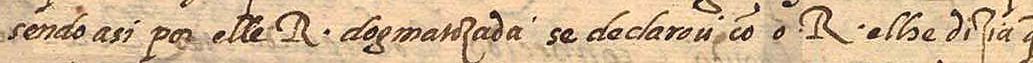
sendo asi por elle R. dogmatizada se declarou co̅ o .R. e lhe dizia q̅
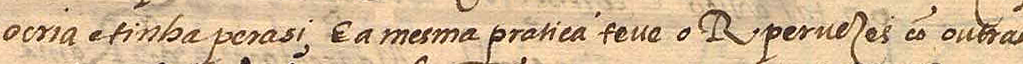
o cria e tinha pera si, E a mesma pratica teue o R. per vezes co̅ outras
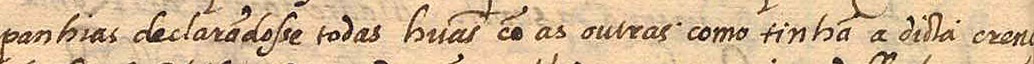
panhias declara̅dosse todas huās co̅ as outras como tinha̅ a dicta cren
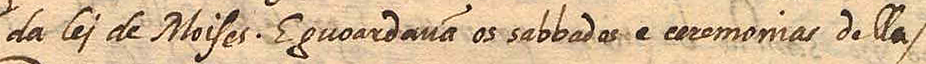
da lej de Moises. E guoardaua̅ os sabbados e ceremonias della /
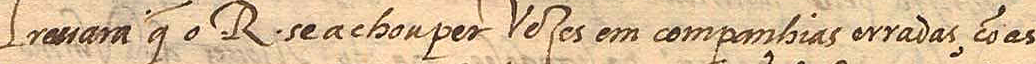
Prouara q̅ o .R. se achou per Vezes em companhias erradas, co̅ as
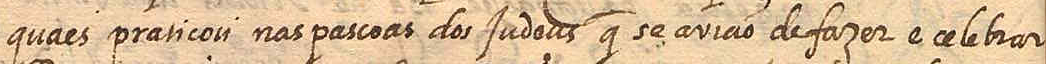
quaes praticou nas pascoas dos Judeus q̄ se aviaõ de fazer e celebrar
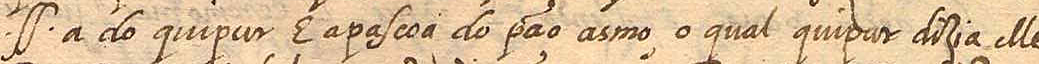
.ss. a do quipur E a pascoa do pãa̅o asmo, o qual quipur dizia elle
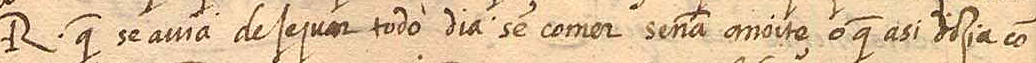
R. q̅ se auia de Jejuar todo dia se̅ comer sena̅ a noite , o q̅ asi dizia co̅
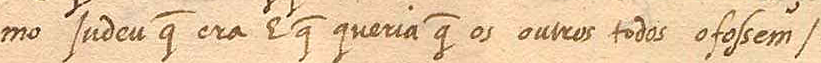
mo Judeu q̅ era E q̄ queria q̅ os outros todos o fossem /.
